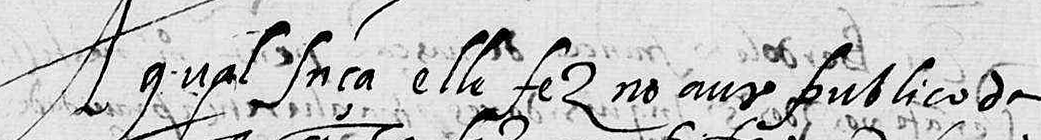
A qual snça elle fez no auto publico da
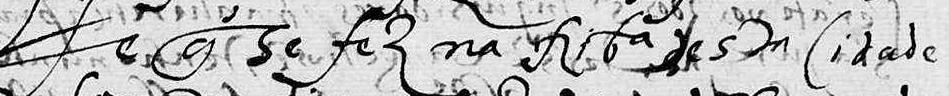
fe q̄ se fez na Rib̄a desta Cidade
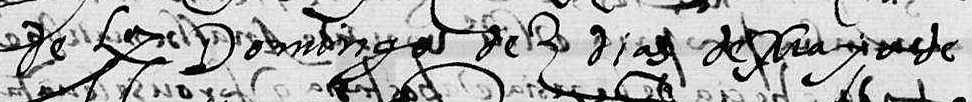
de Lxa Domingo dez dias de Mayo de
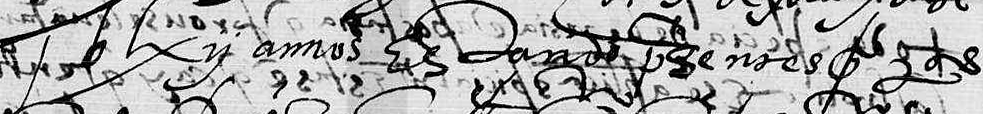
j̄ blxij annos E stando p̄sentes p̄o tas
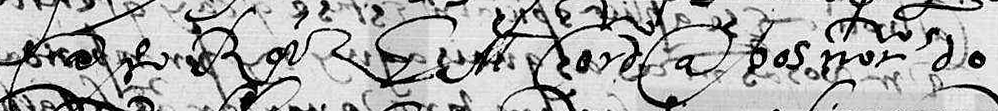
āto Roiz̄ q̄ E Mel Cordro ābos notros do
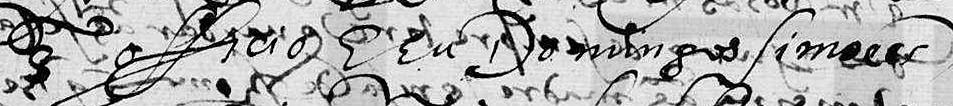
sto officio E Eu Domingos Simoeẽs
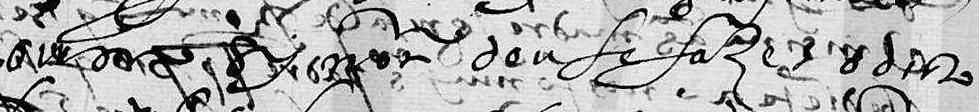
outrosy notro dou fe fazer o dicto
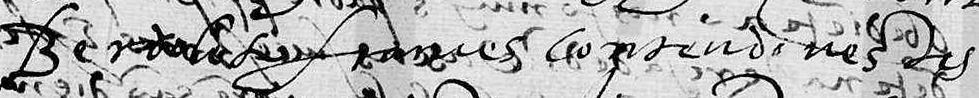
Berdoleto frances conteudo nestes
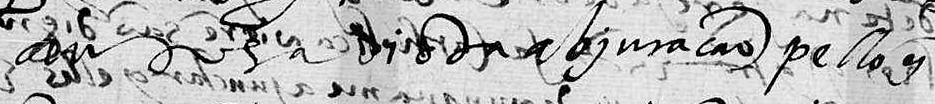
autos e vista abjuração pello q̄
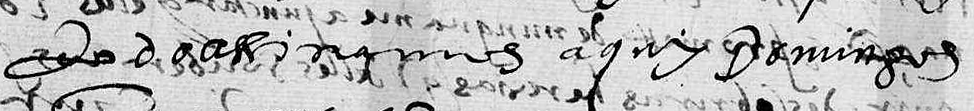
todo assinamos aquy Domingos
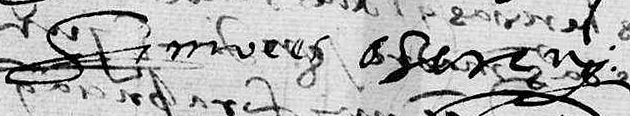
Simoees o screuy.
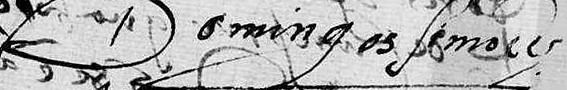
Domingos Simoeẽs
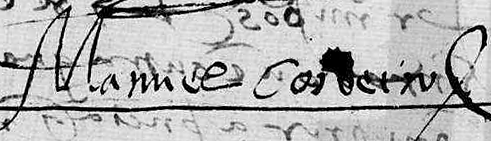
Manuel Cordeiro
